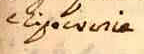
e hipocrezia
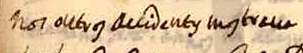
nos outros accidentes mostraua
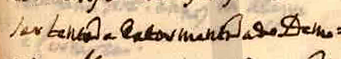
ser tentada E atormentada do Demo
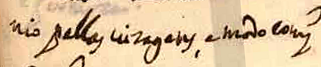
nio pellas uizagens, e modo com q̄
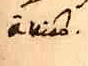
a uiaõ.
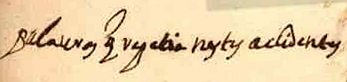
palavras q̄ repetia nestes accidentes
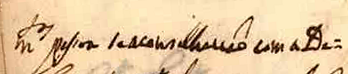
mtas pessoa se aconselhauaõ com a De
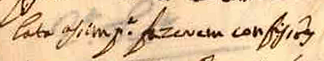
lata assim p.a fazerem confissões
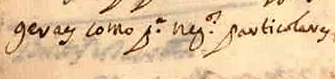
geraes como p.a neg.os particolares
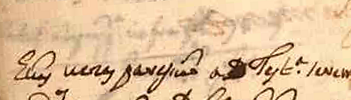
huās uezes paressiaõ a D Test.a serem
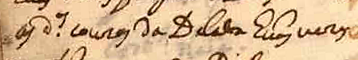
as d.as couzas da Delata huās uezes
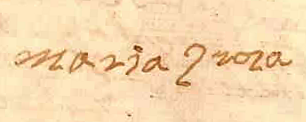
maria Roza
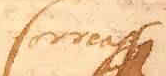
Correa
